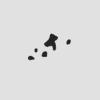德
